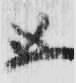之
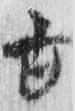古（故）
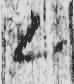乙
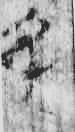丑
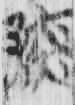郯
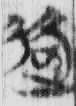○（路）
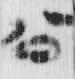公
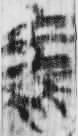蛙
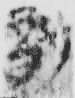戠
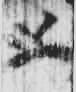之
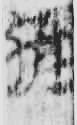勁
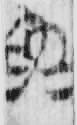爲
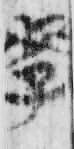李
